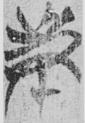庚（康）
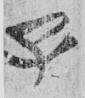子
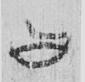曰
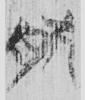肰（然）
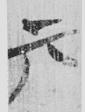亓（其）
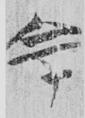宔（主）
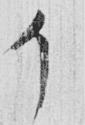人
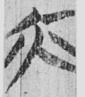亦
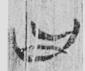曰
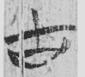古
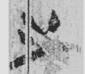之
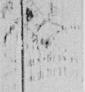爲
